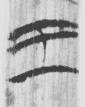王
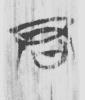君
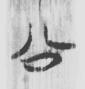公
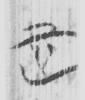正
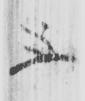之
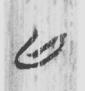㠯（以）
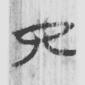四
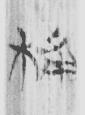{木甫}
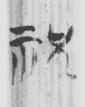祝
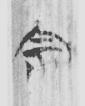宗
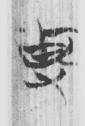史
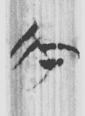帀
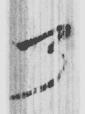乃
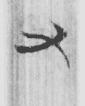又
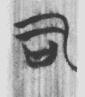司
